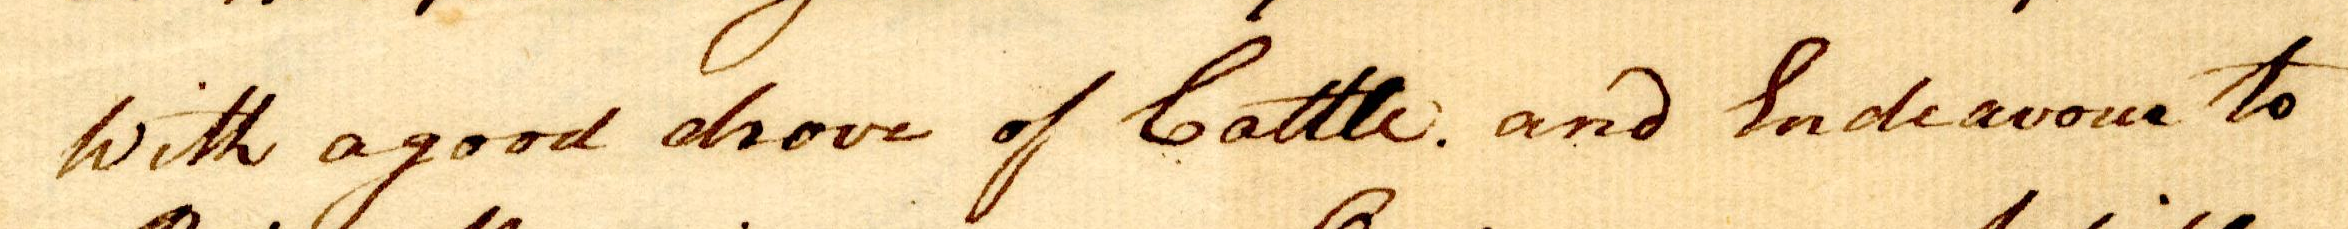with a good drove of Cattle and Endeavour to
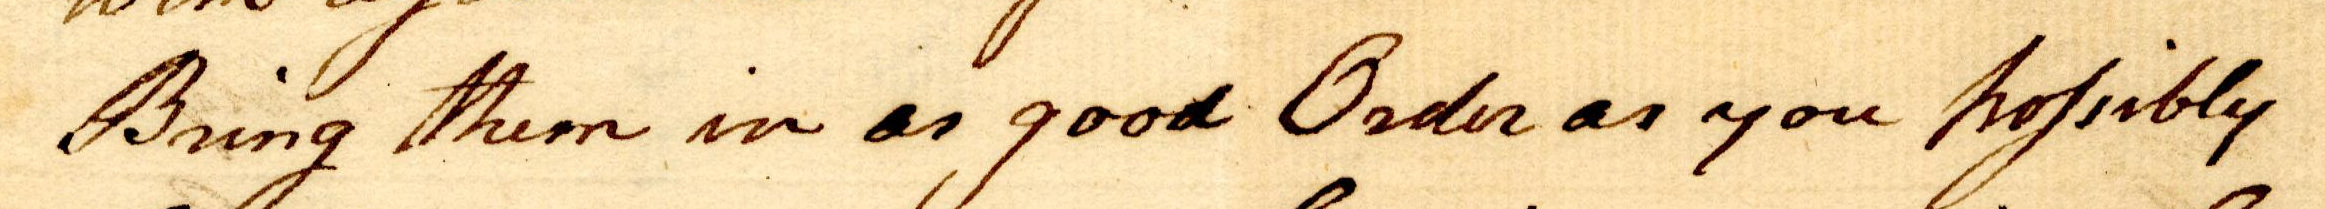Bring them in as good Order as you possibly
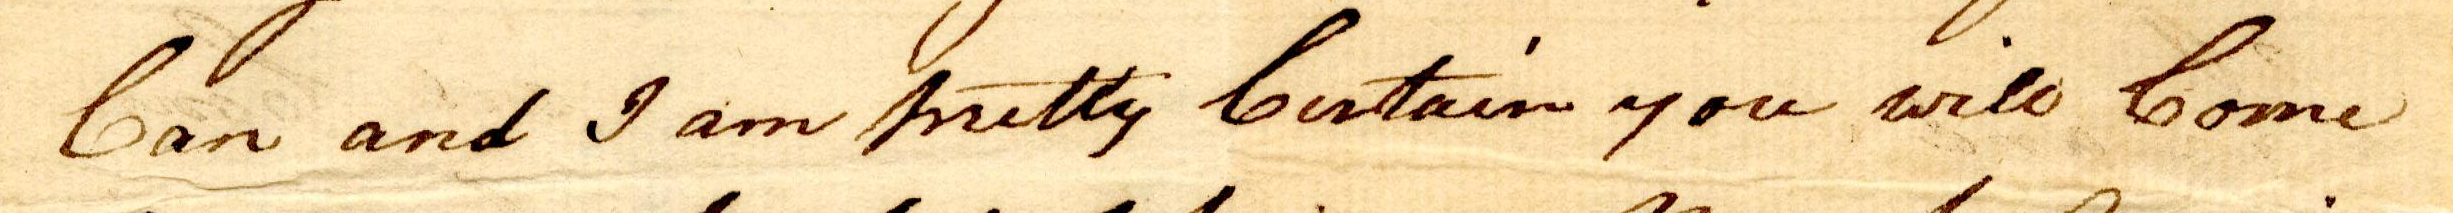Can and I am pretty Certain you will Come
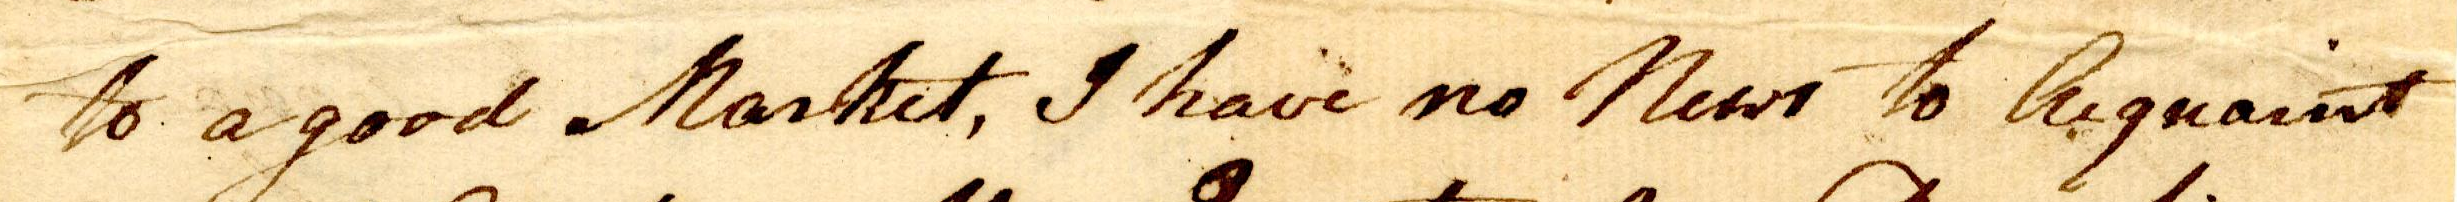to a good Market, I have no News to Acquaint
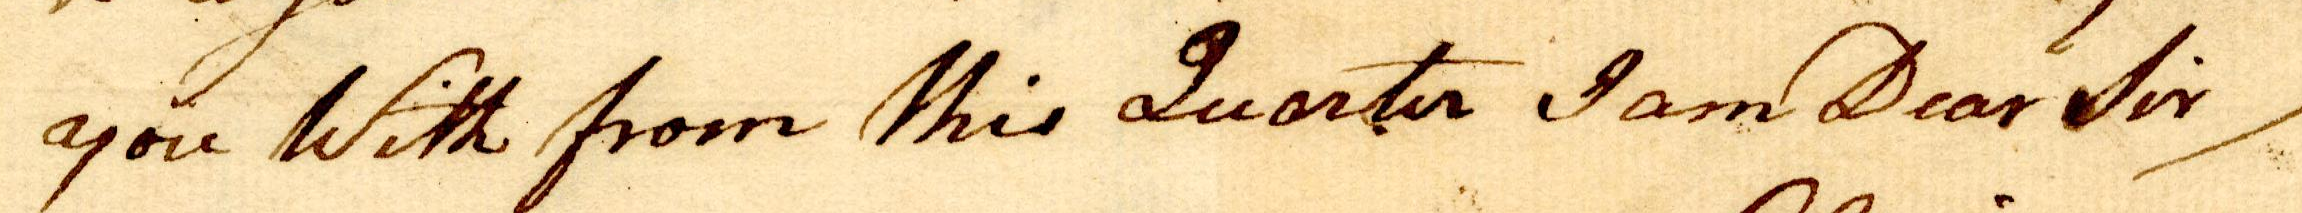you With from this Quarter I am Dear Sir
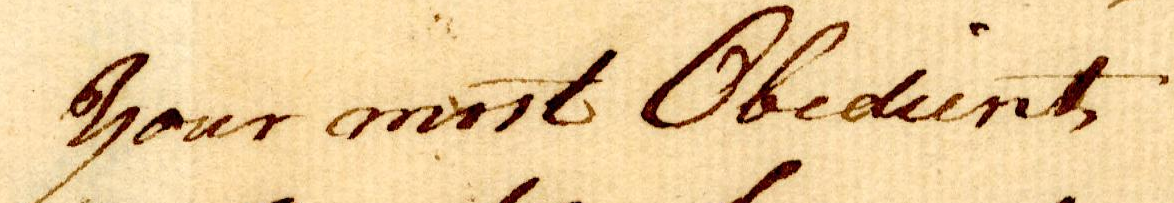Your most Obedient,
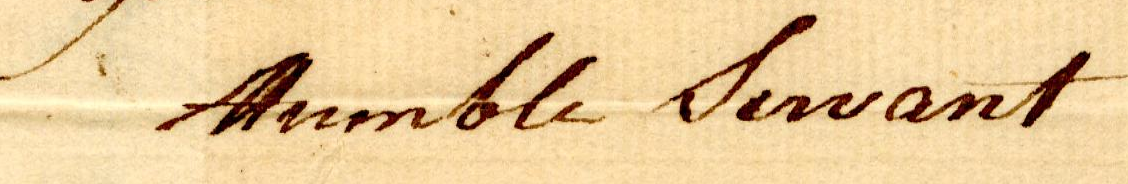Humble Servant
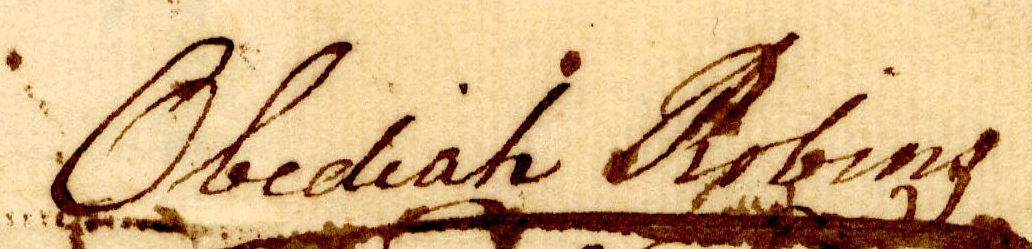Obediah Robins
